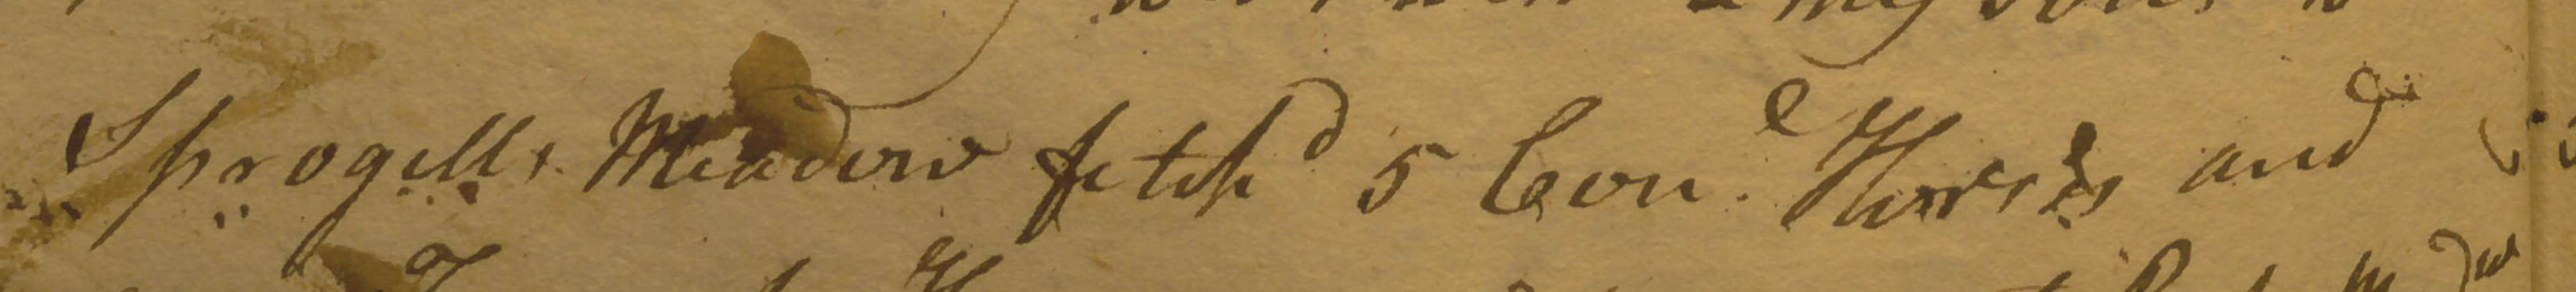Sprogills Meadow fetch^d 5 Con^l. Horrs & and
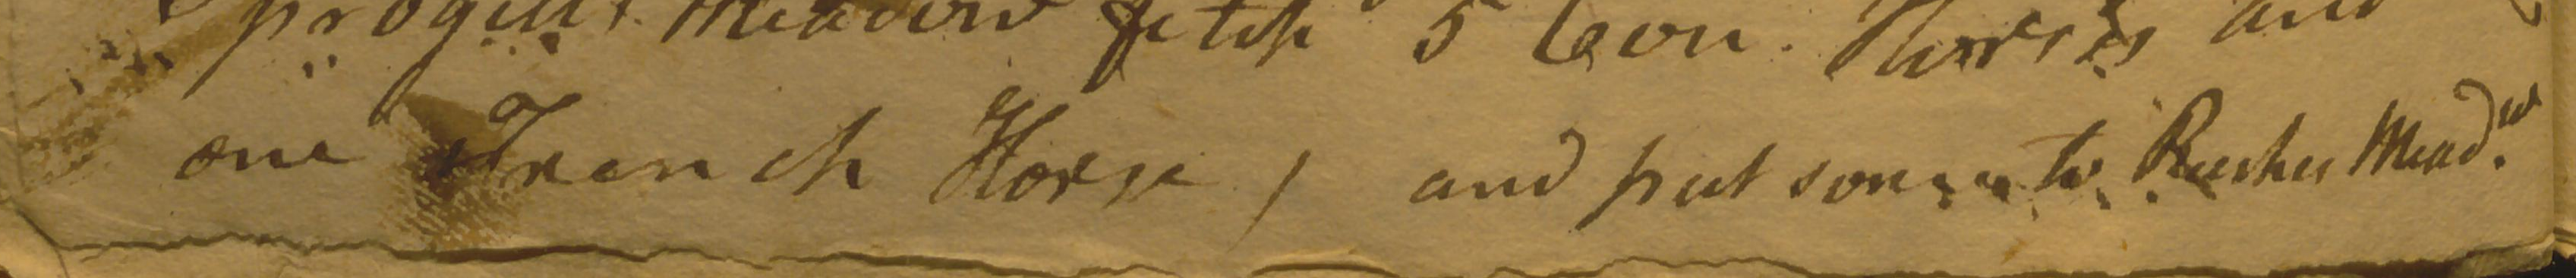one French Horse, and put some to Rushes Mead^w.
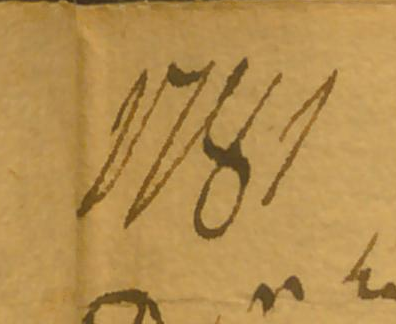1781
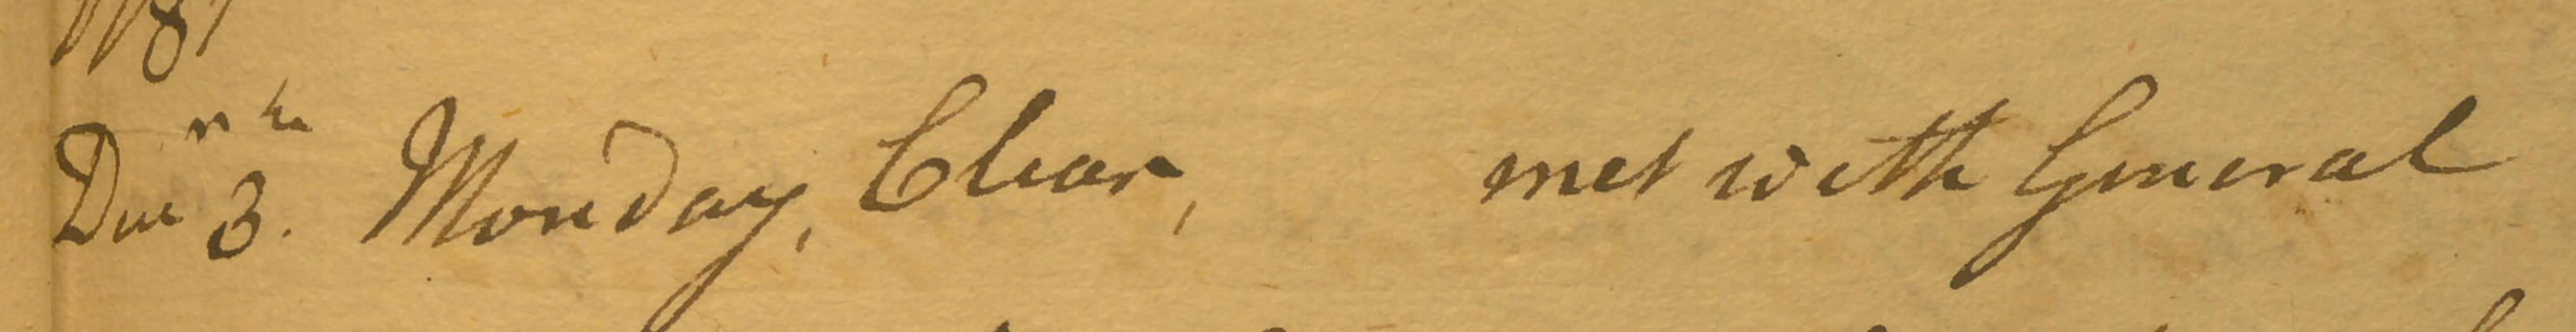Dec^r 3^th. Monday, Clear, met with General
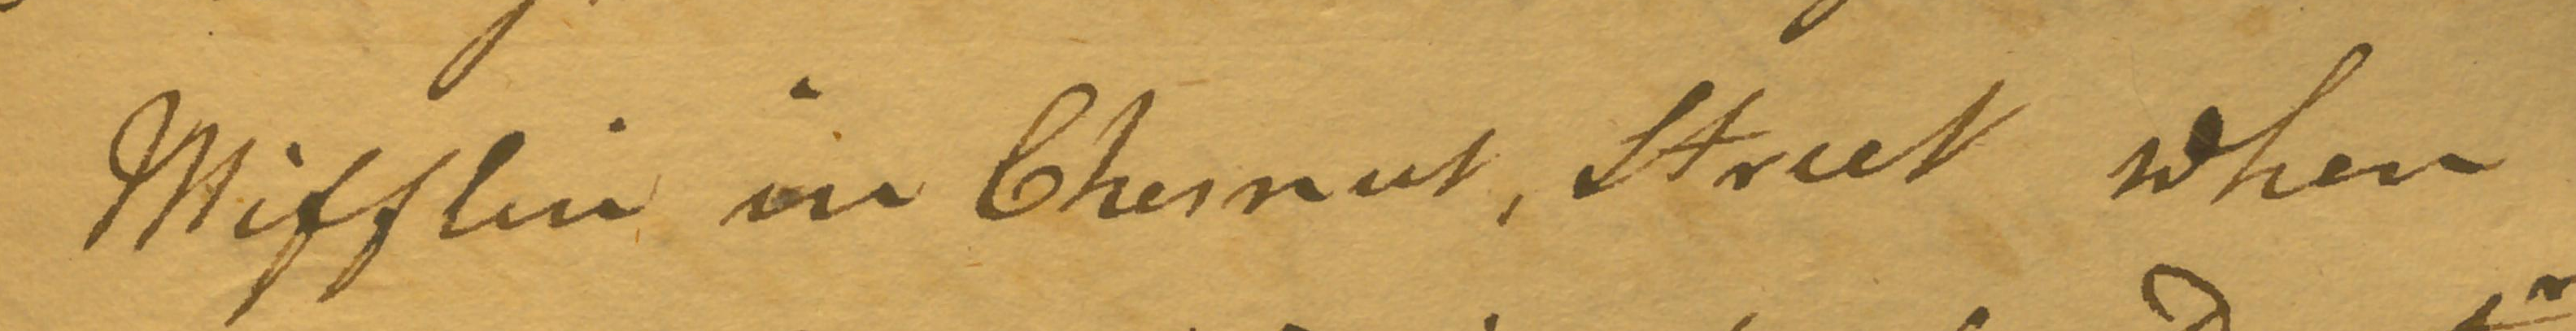Mifflin on Chesnet, Street when
